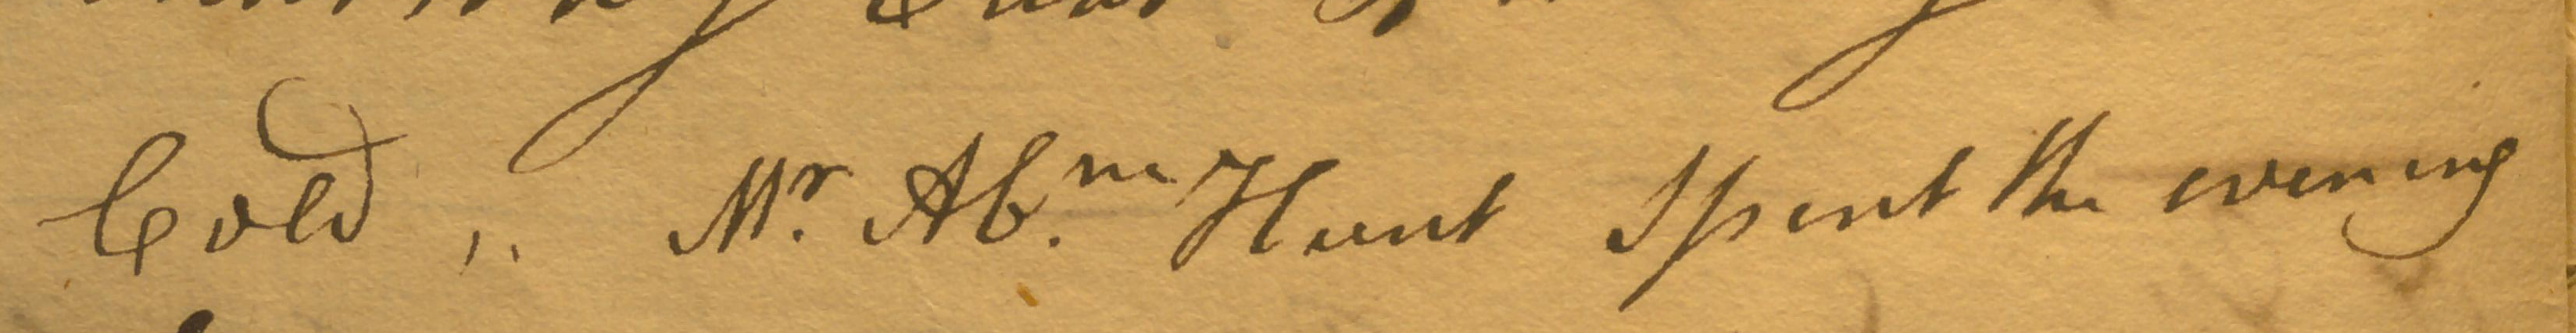Cold, M^r. Ab^m. Hunt spent the evening
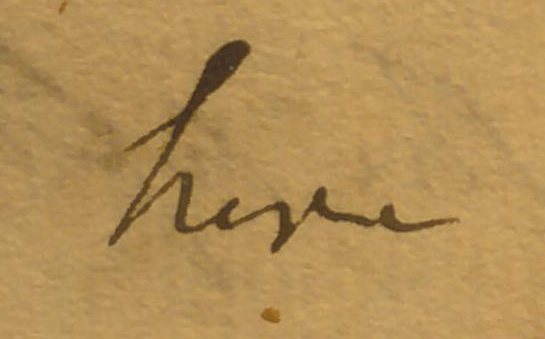here
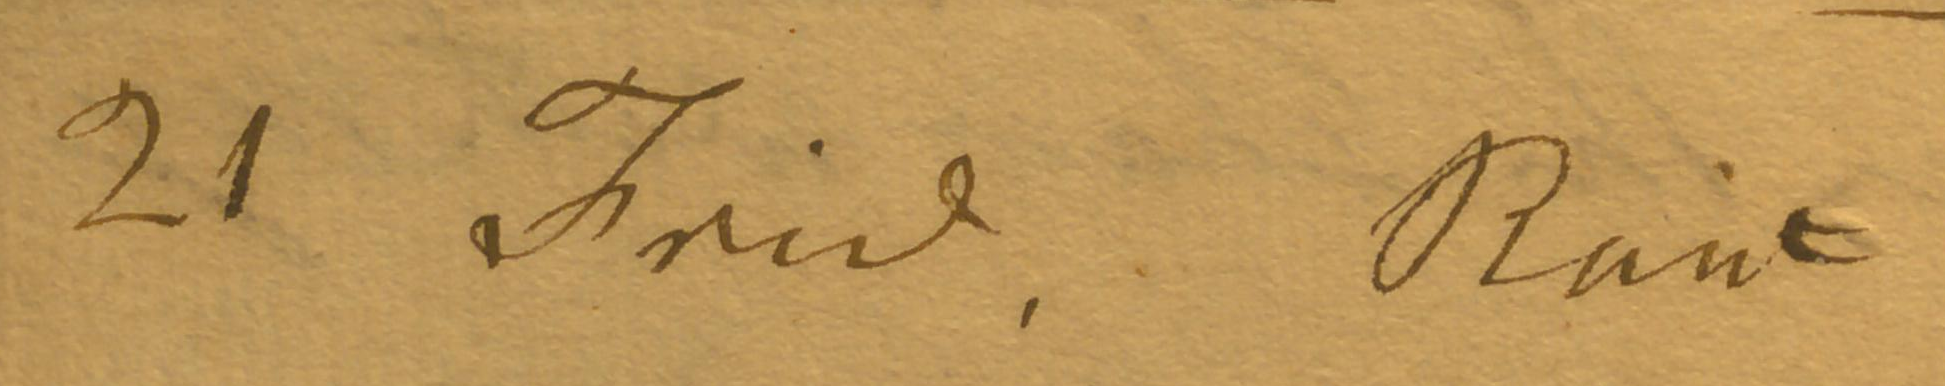21 Frid Rain
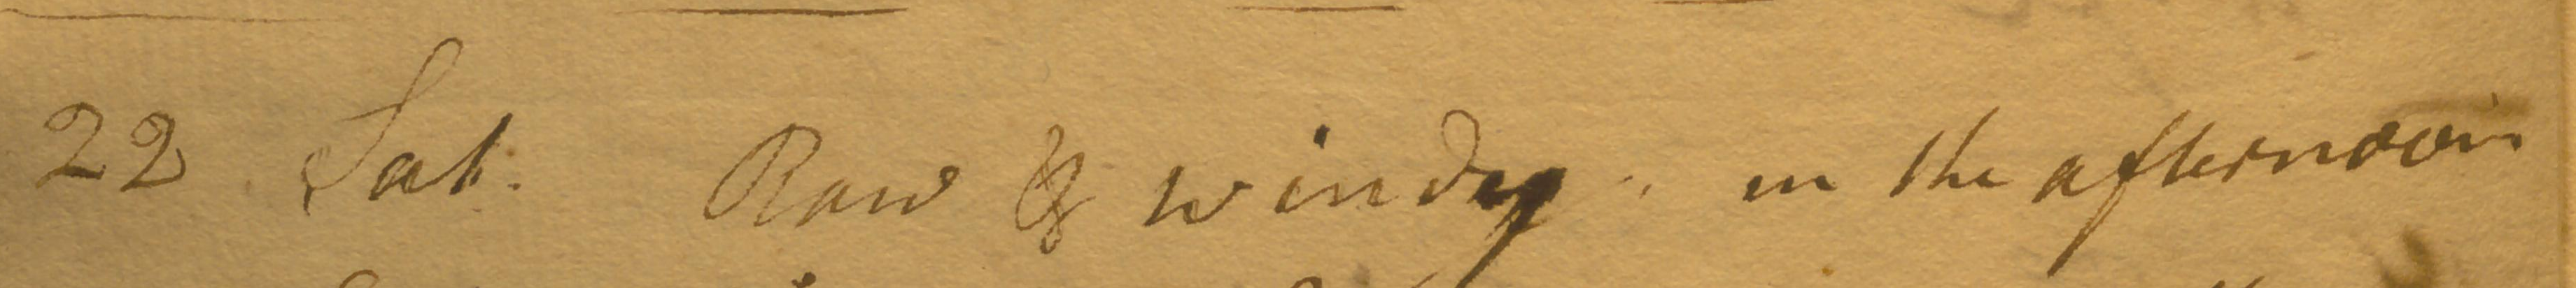22 Sat. Raw & windy, in the afternoon
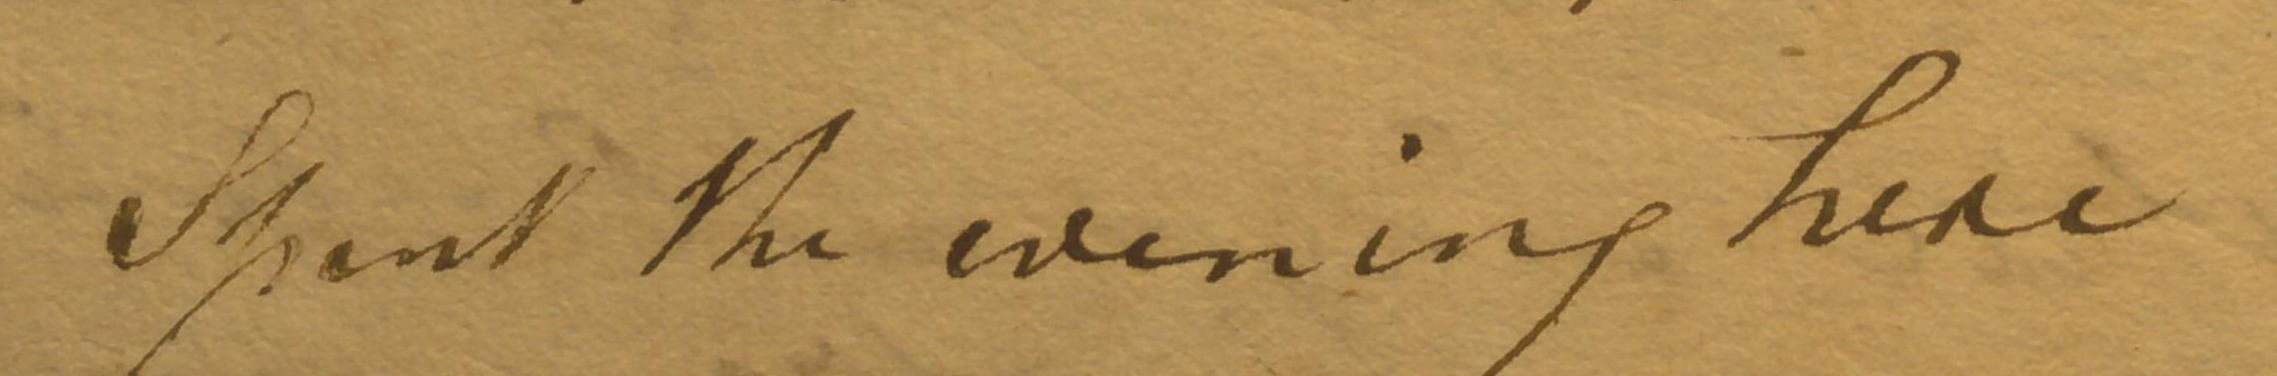Spent the evening here
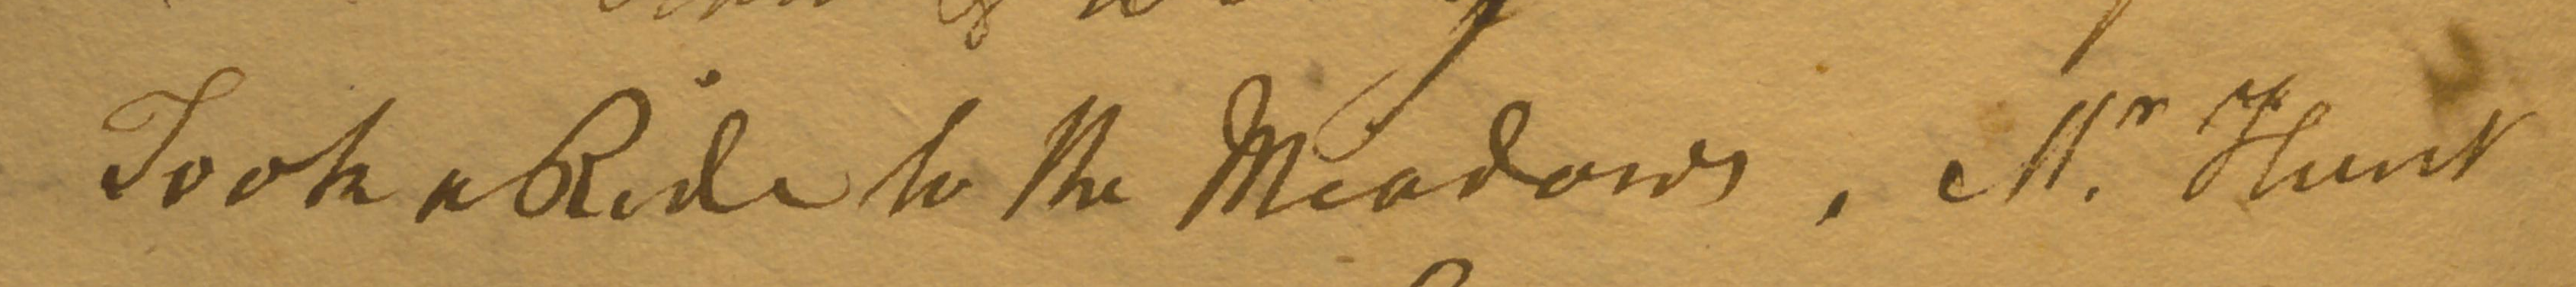Took a Ride to the Meadows, M^r. Hunt
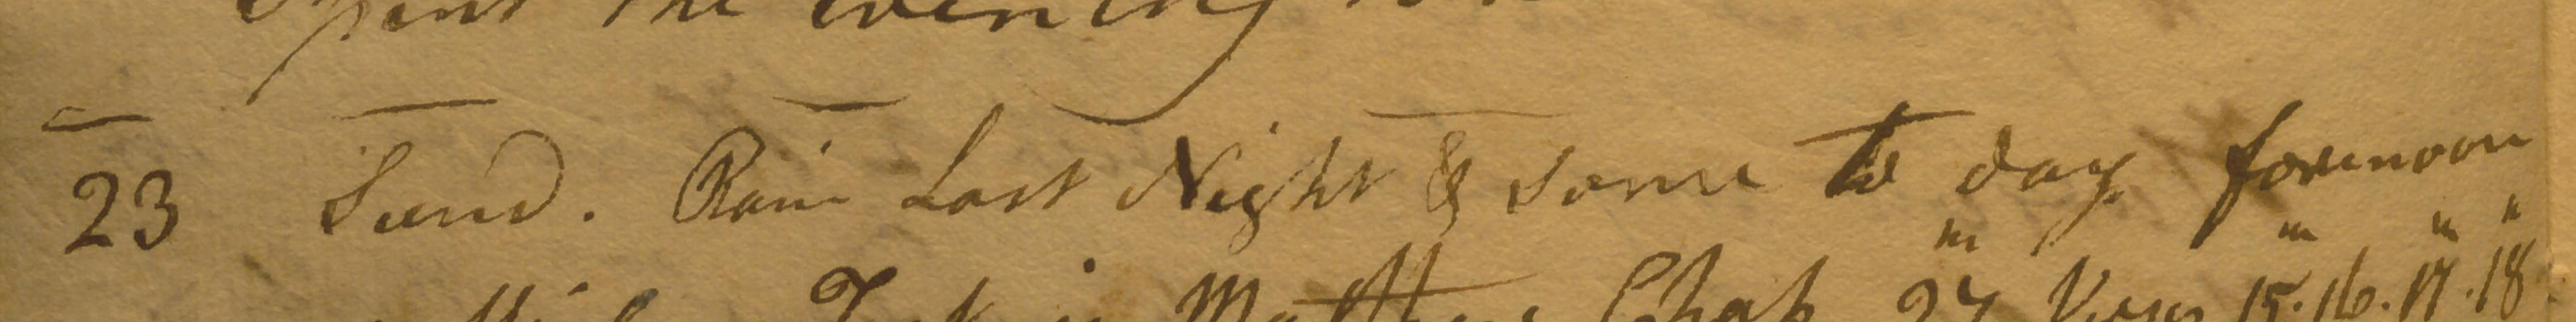23 Sund. Rain Last Night & some to day forenoon
